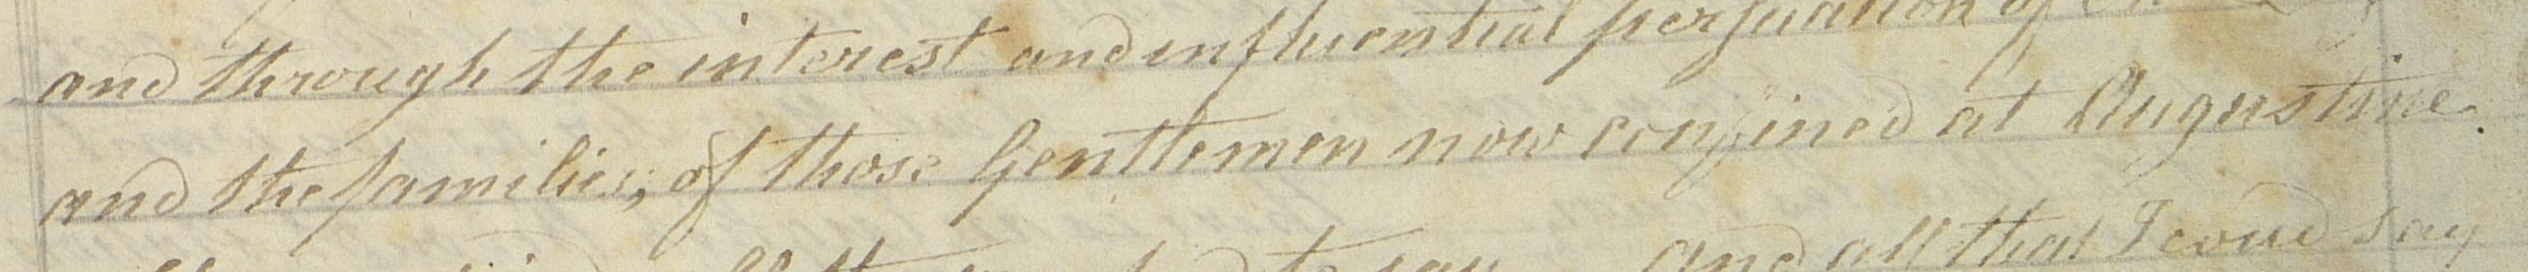and the families, of those Gentlemen now confined at Augustine
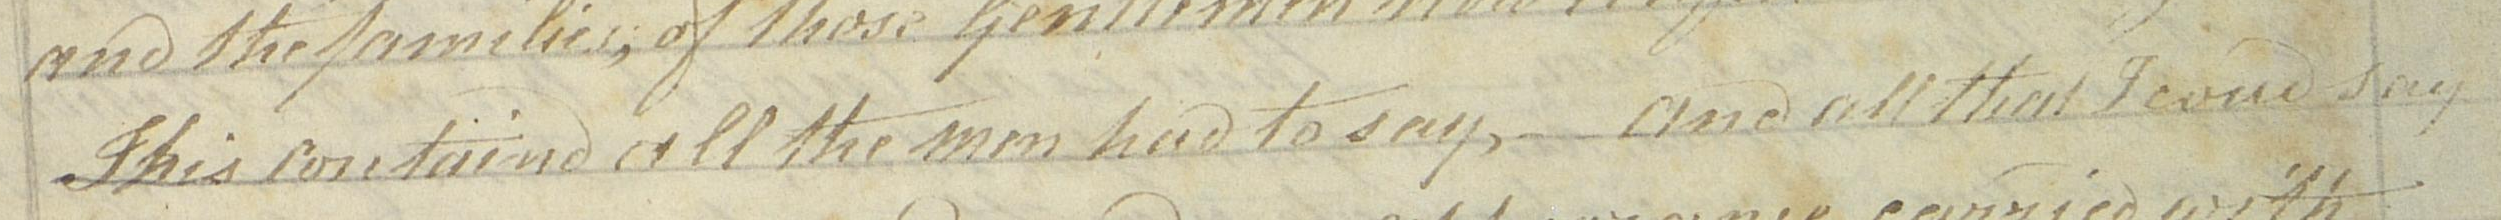This containd all the men had to say, And all that I coud say
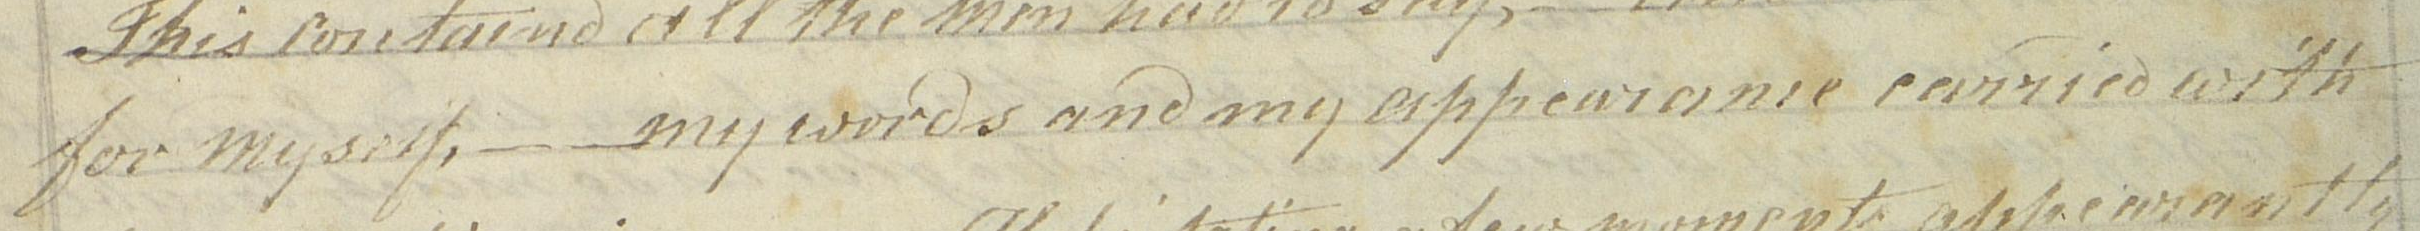for myself, my words and my appearance carried with
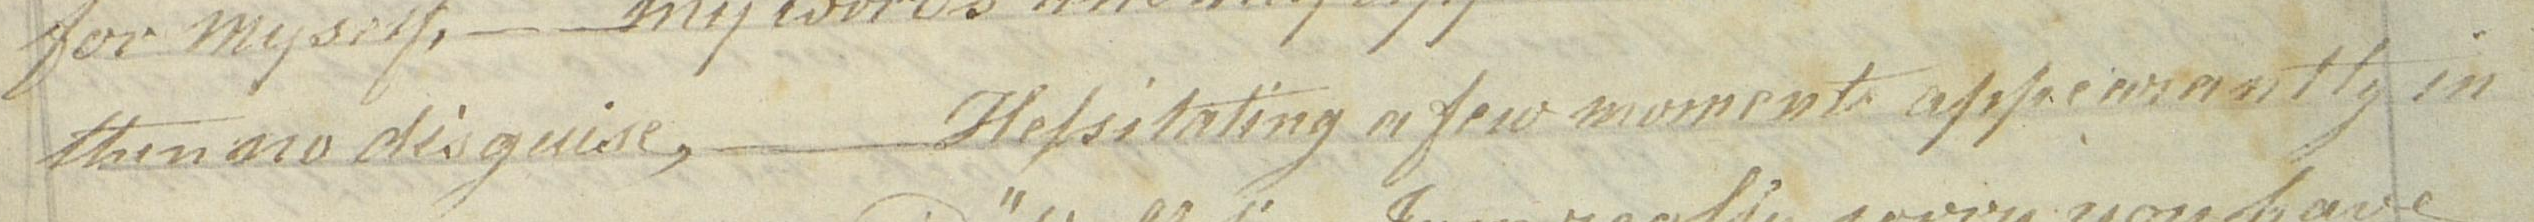then no disguise, Hessitating a few moments appearantly in
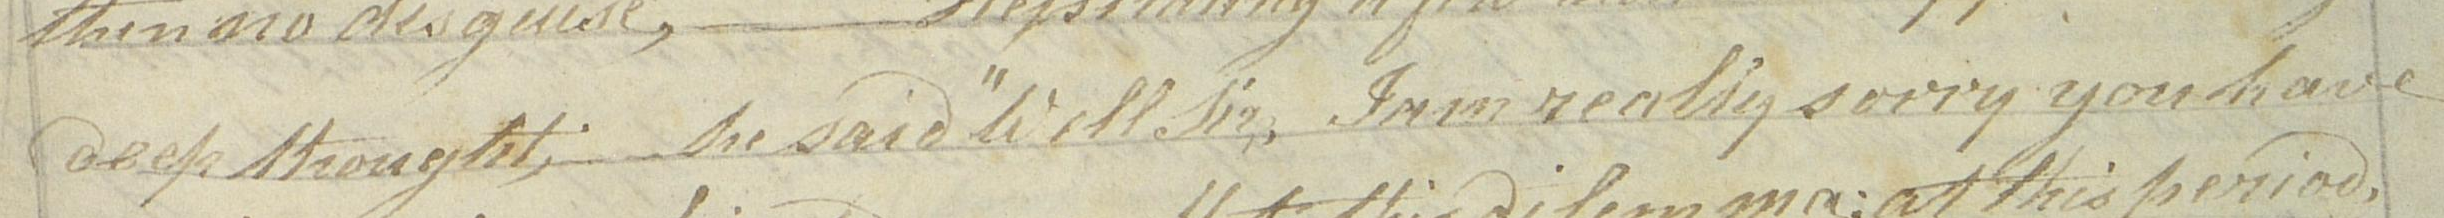deep thought; he said "Well Sir, I am really sorry you have
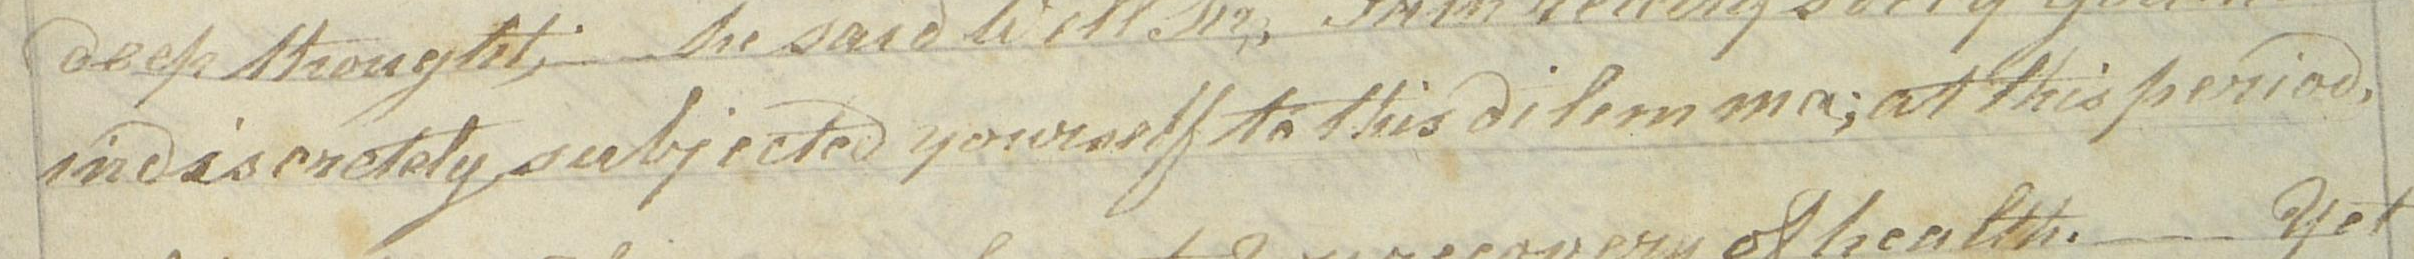indiscretely subjected yourself to this dilemma; at this period,
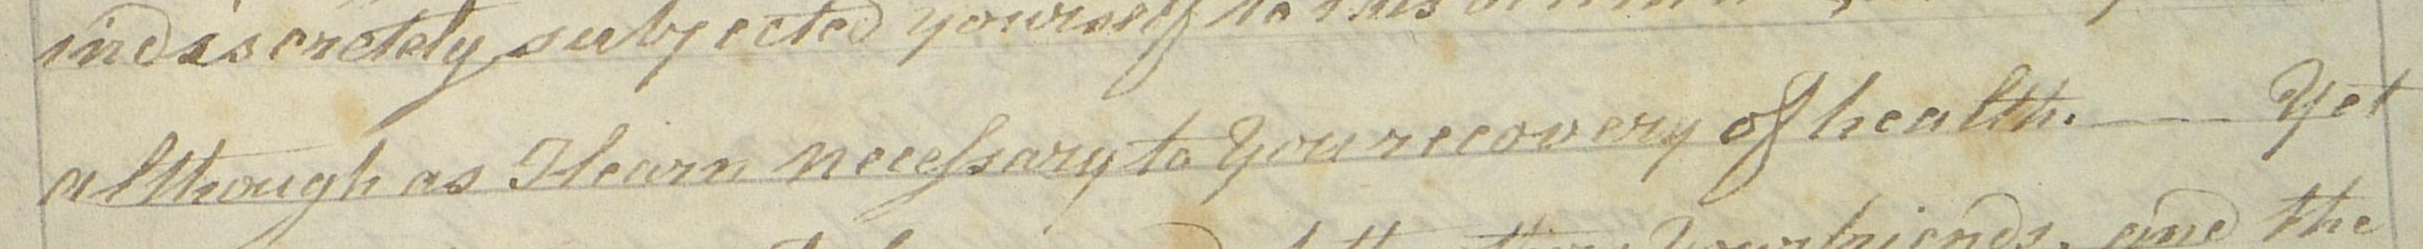although as I learn necessary to you recovery of health. Yet
